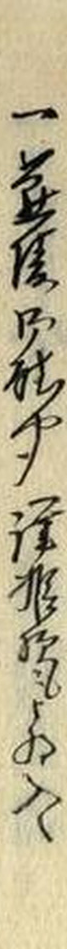一燕凌御聴聞謹姫様も被為入候
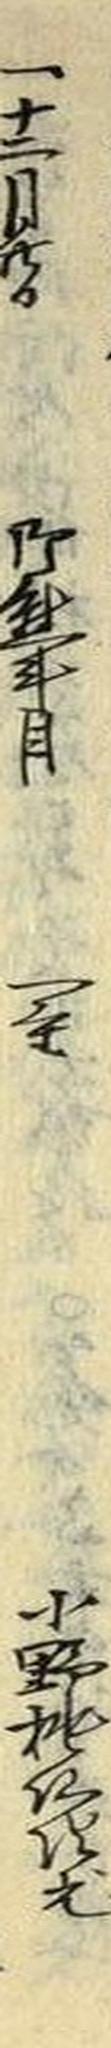一十二月廿日御熨斗目一重小野桃仙院老
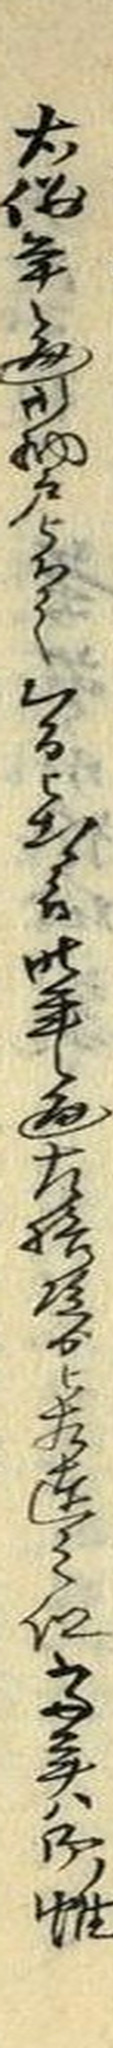右例年之通御納戸被下之今日被出候ニ付昨年之通左膳殿ゟ被相達之但当年ハ御帷
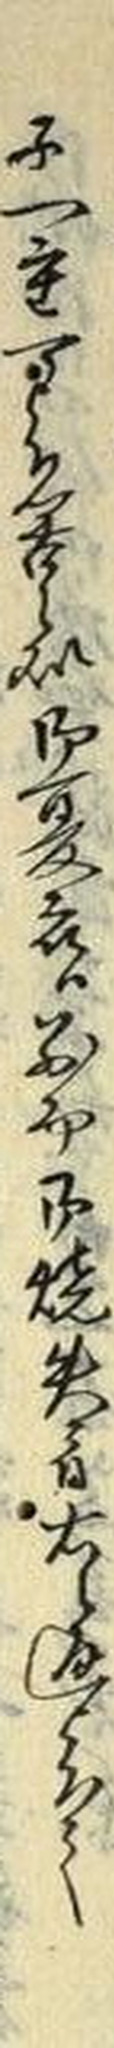子一重可被下筈之処御夏衣ハ別而御焼失ニ付右之通被下之
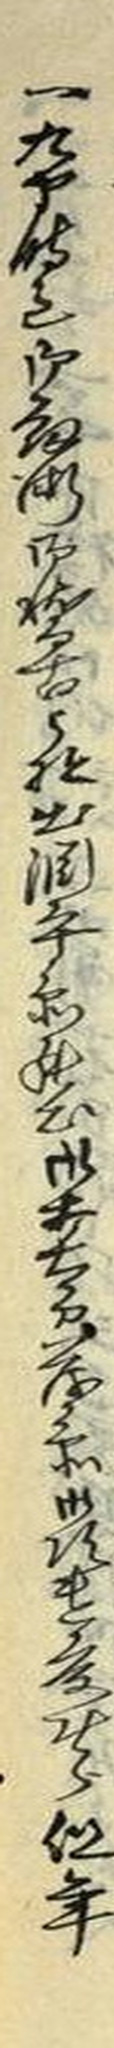一九半時過御剣術御稽古被遊出淵平兵衛罷出御打太刀茂兵衛御次遣藤次郎但年
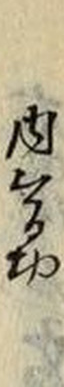内今日切
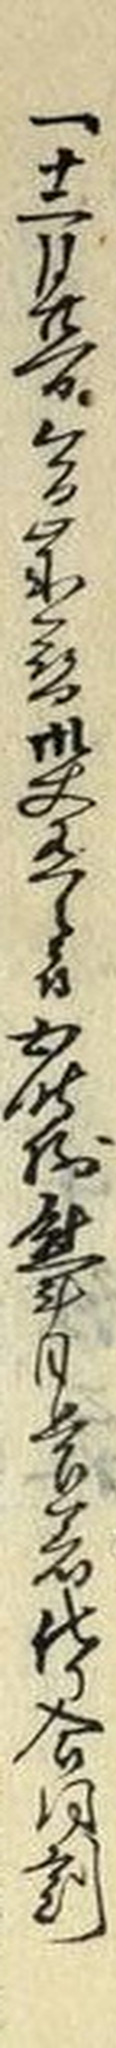一十二月廿一日今日歳暮御使有之ニ付五時揃熨斗目上下着代り合同刻
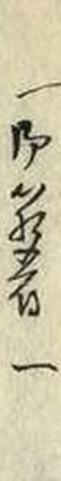御箱肴一
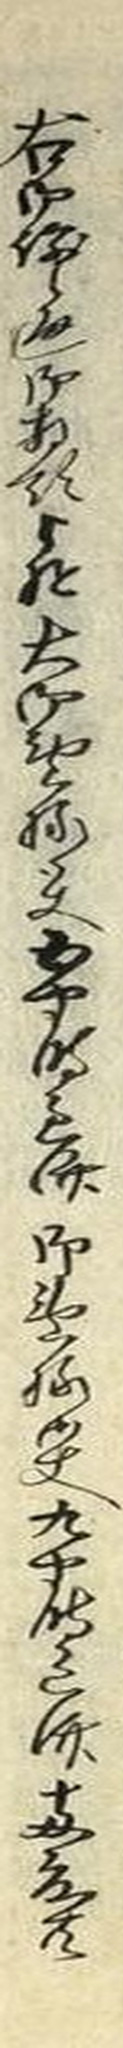右御例之通御拝領被遊大御台様御使五半時過済御台様御使九半時過済両度共
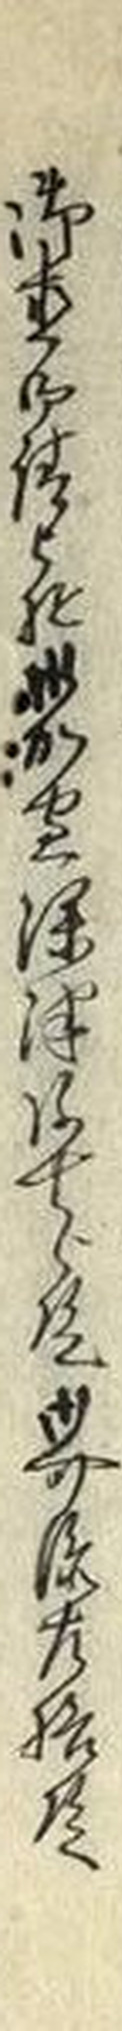御直御請被遊御加宜深津弥七郎殿御介添左膳殿
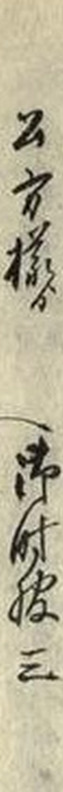公方様ゟ御時服三
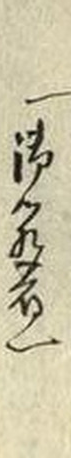御箱肴一
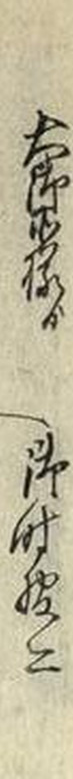大御所様ゟ御時服二
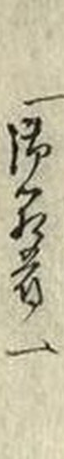御箱肴一
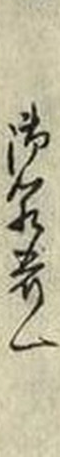御箱肴一
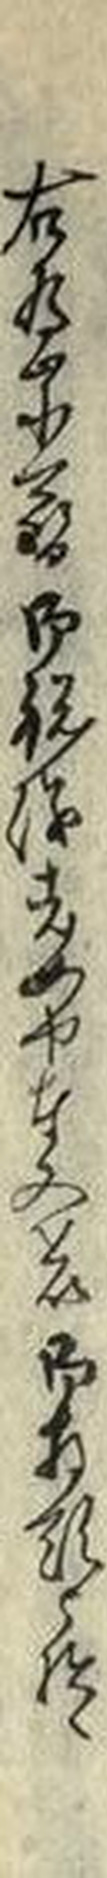右為歳暮御祝儀老女中奉文を以御拝領被遊候
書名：少傅日録抄（斉善付側向頭取日記、在府）
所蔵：福井県文書館 Fukui Prefectural Archives
